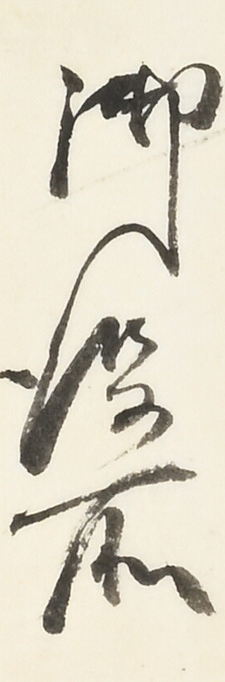御役所
